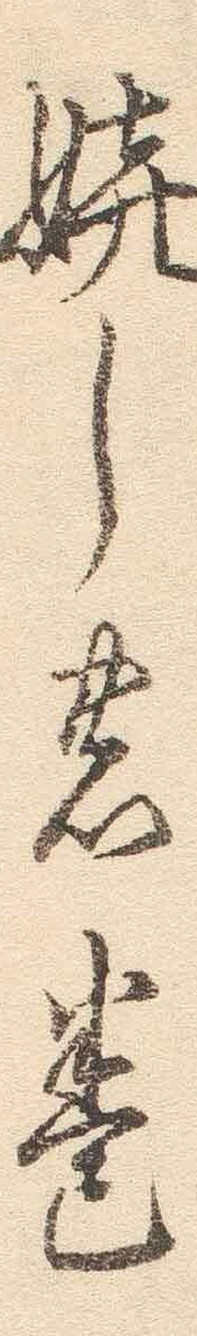嬉しの巻
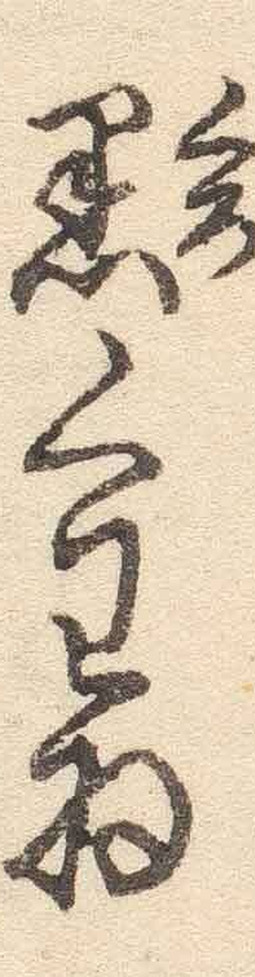黒くわゐ
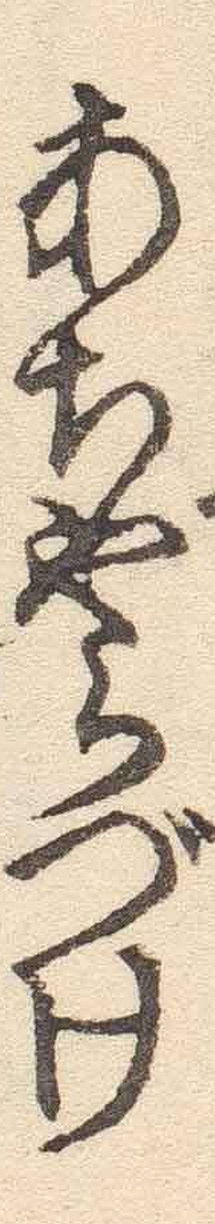あちやらづけ
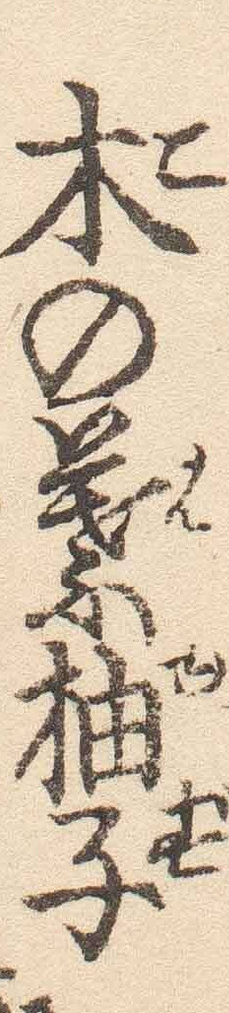木の葉柚子
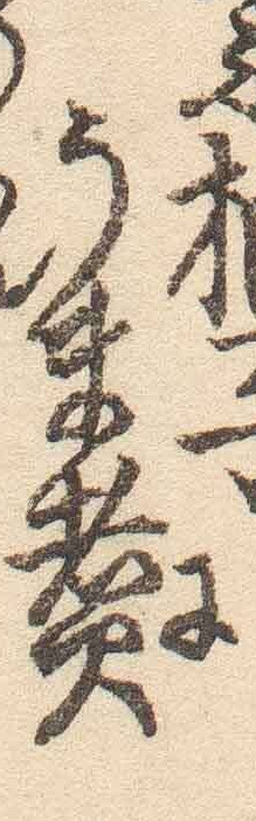うま煮
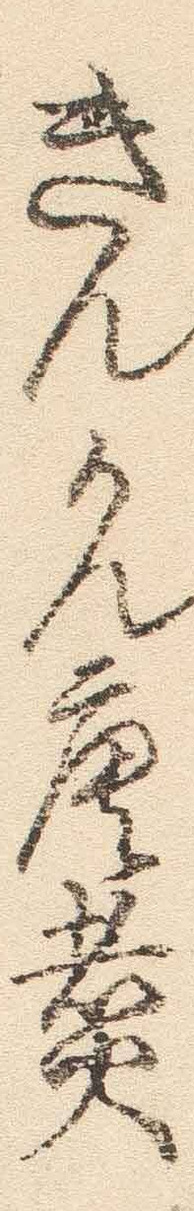きんかん唐煮
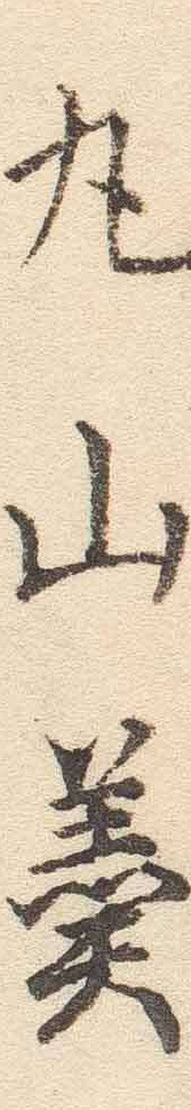丸山羹
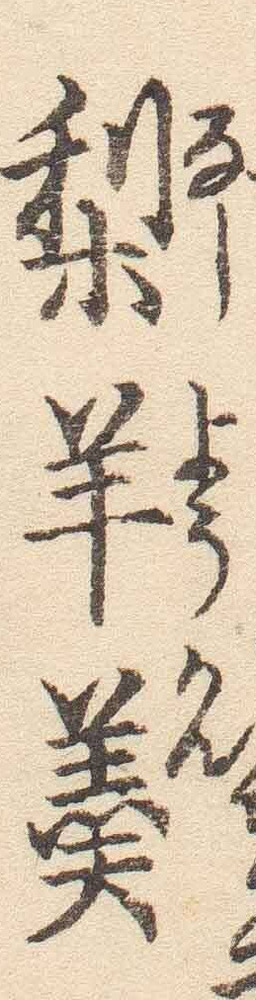梨羊羹
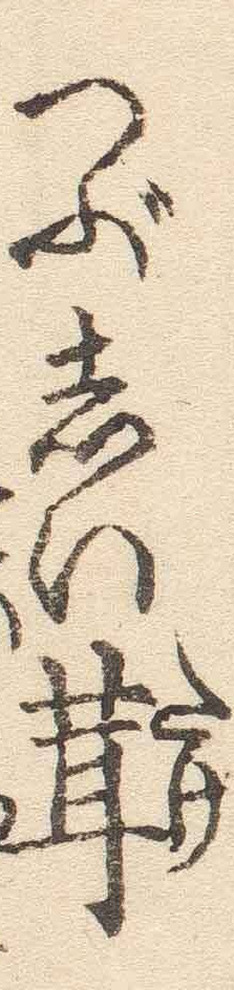つぶしい茸
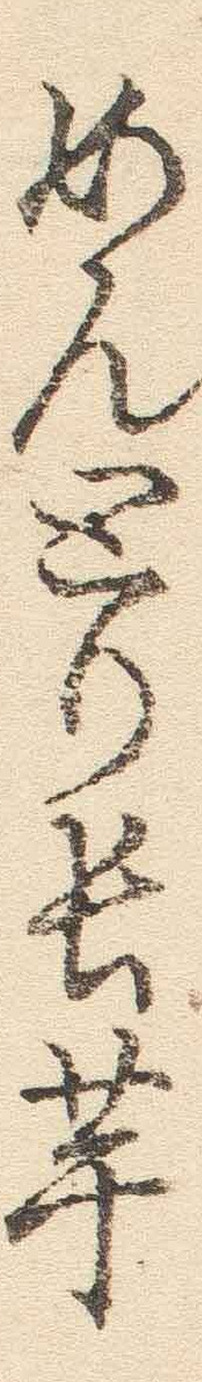めんとり長芋
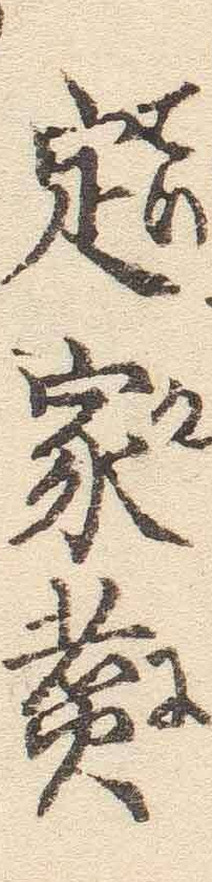定家煮
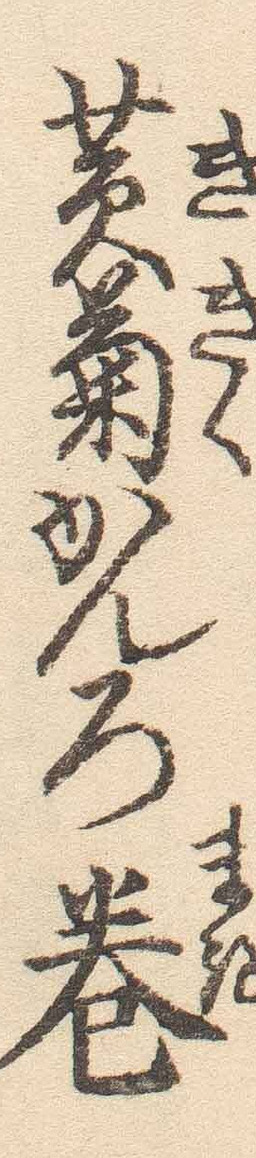黄菊かんろ巻
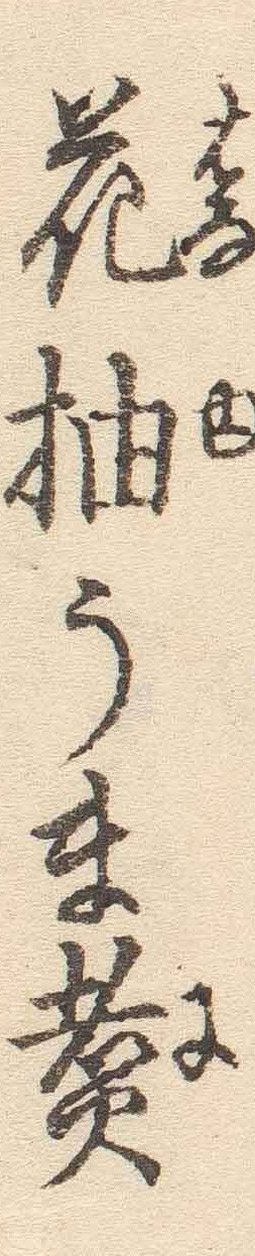花柚うま煮
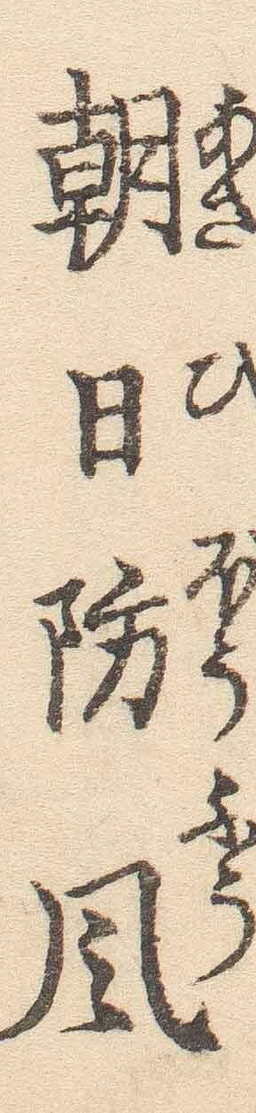朝日防風
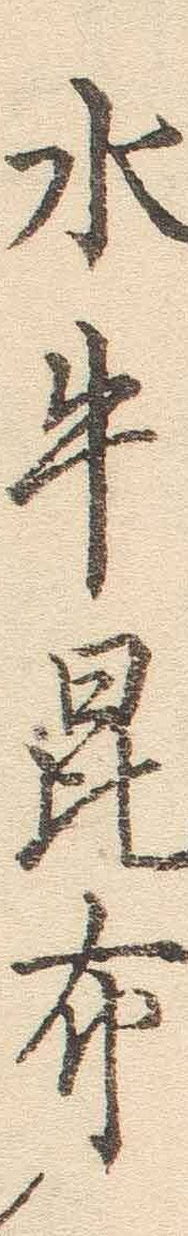水牛昆布
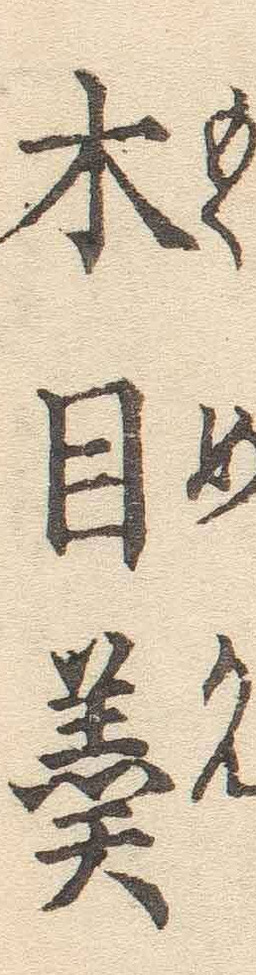木目羹
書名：料理通
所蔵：東京学芸大学附属図書館 国文学研究資料館
